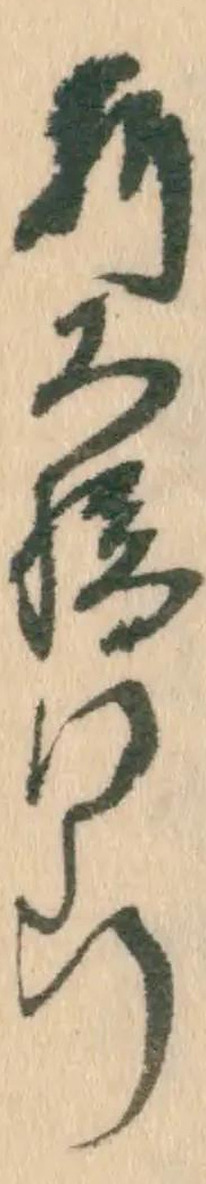新大橋同断
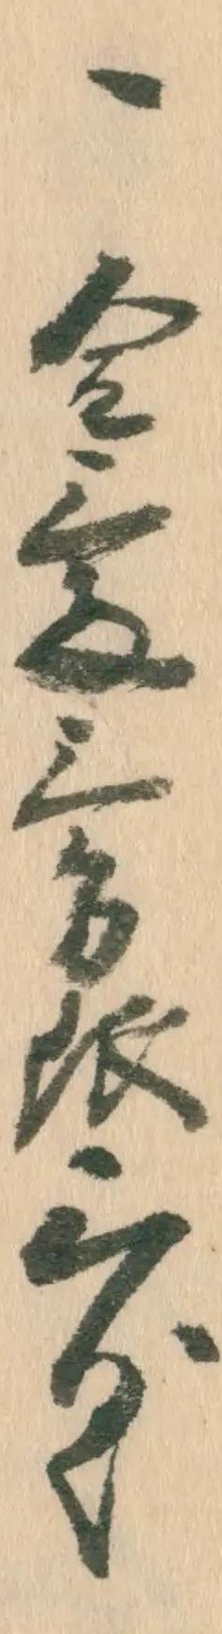一金三両三分銀三匁
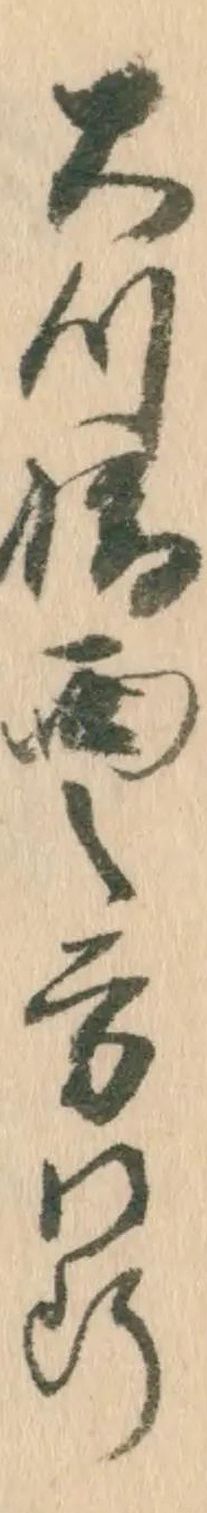大川橋西之方同断
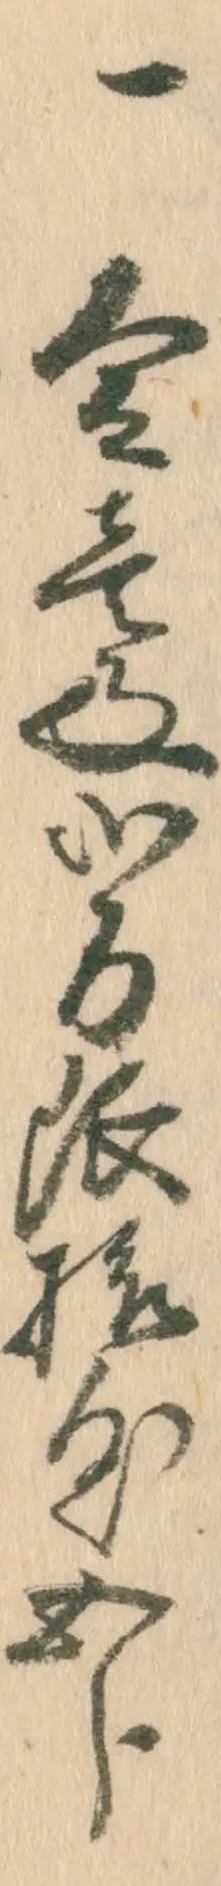一金壱両弐分銀拾匁五分
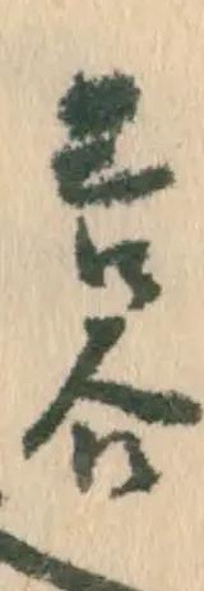三口合
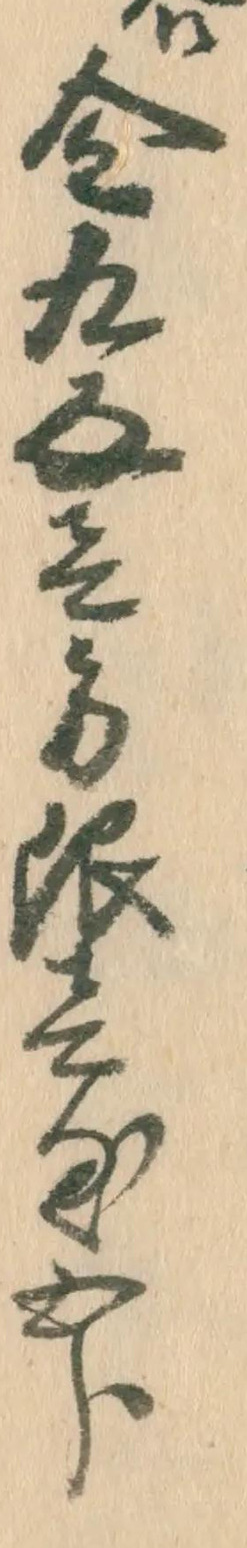金九両壱分銀壱匁五分

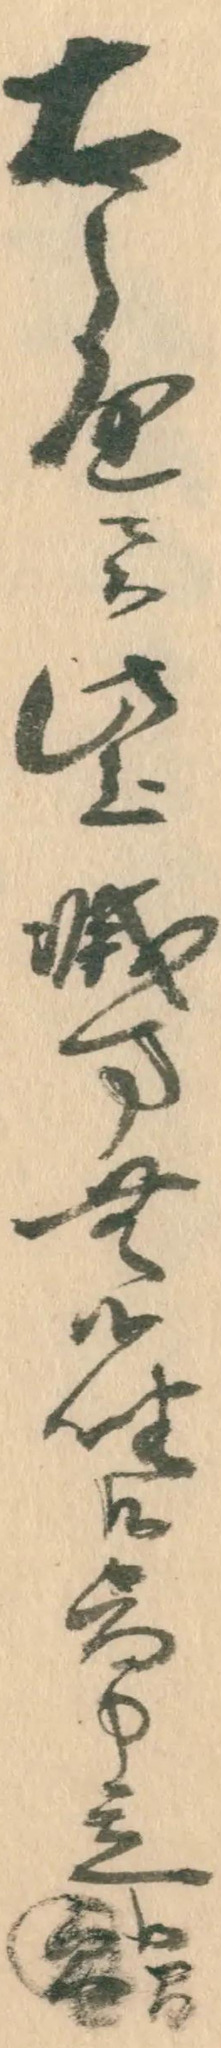右之通ニ而此上減方無御坐候旨申立候間
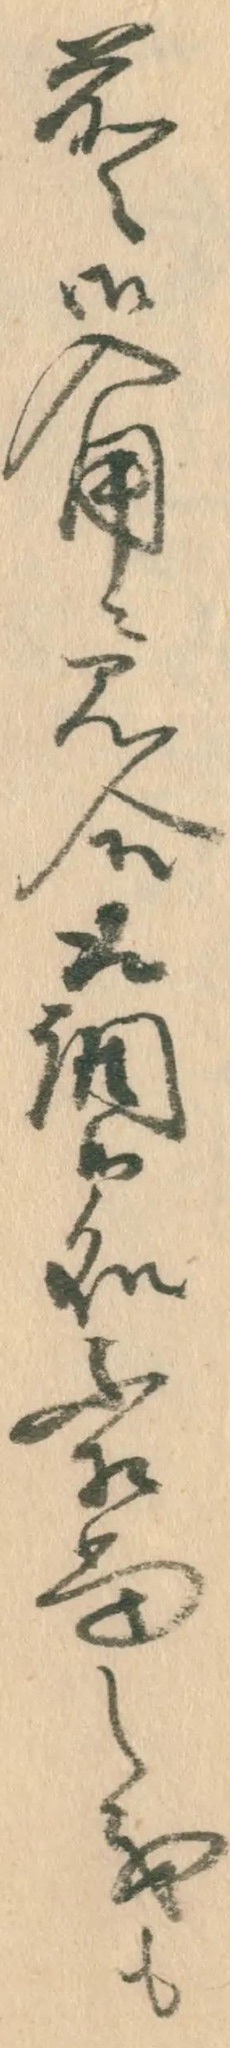前々御入用ニ見合取調候処不相当之義も
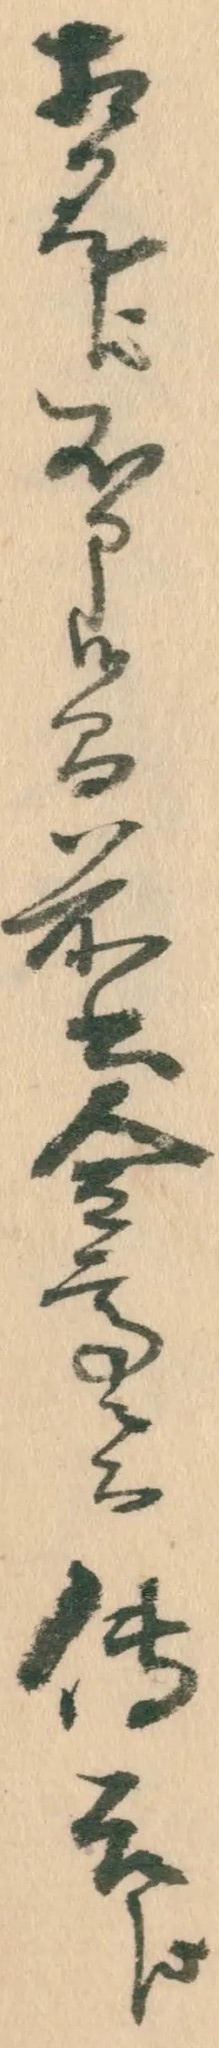相見え不申候間前書金高ニ而伝吉え
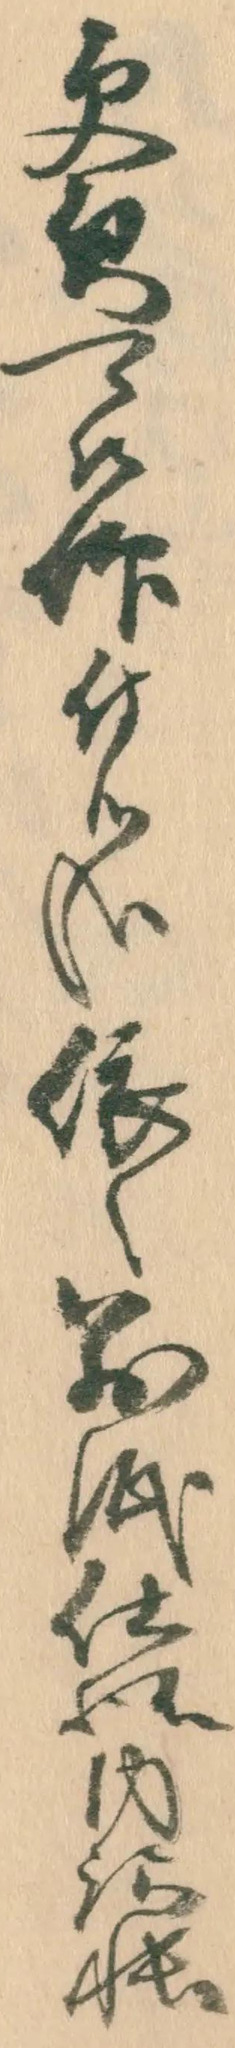受負可被仰付候哉依之別紙仕様内訳帳
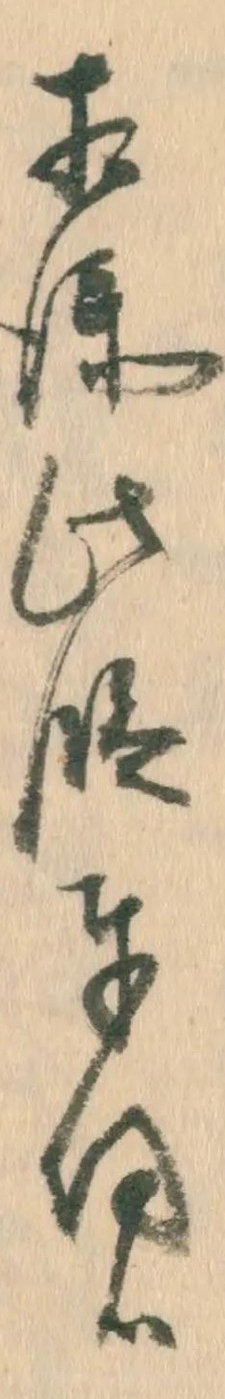相添此段奉伺候
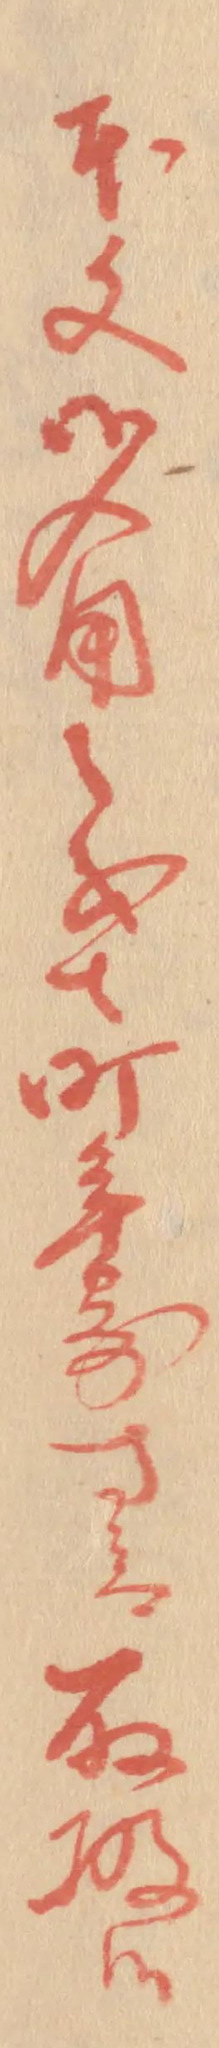本文御入用之義は町年寄方ニ而取扱候
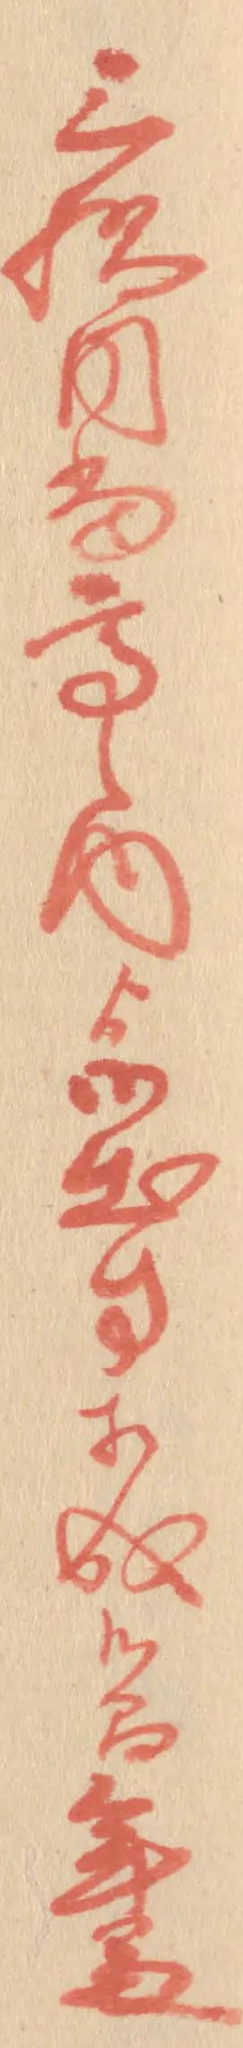三橋目当高之内ゟ御出方相成候間年番
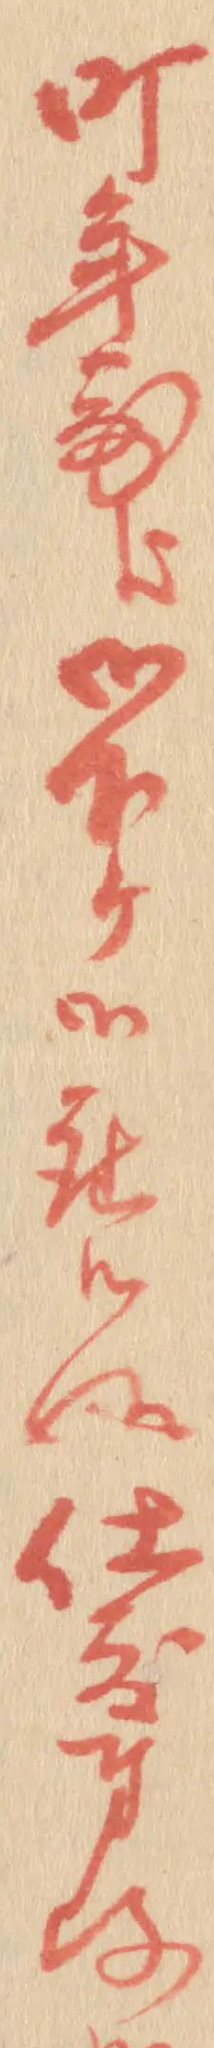町年寄え御下ケ御座候様仕度奉存候
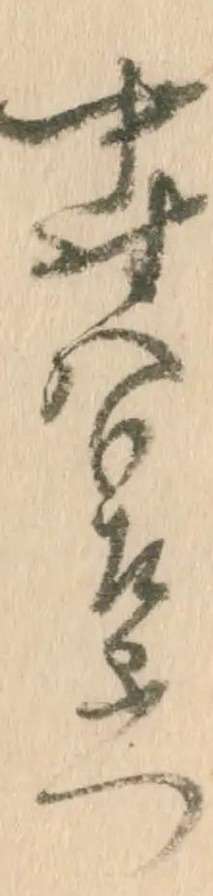中村八郎左衛門

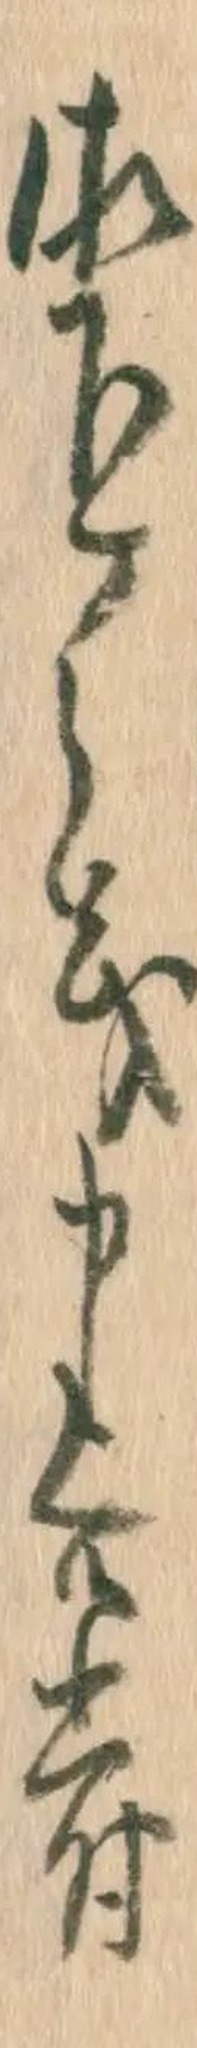御下ケ之義申上候書付
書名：三橋 17巻. [8] 三橋小破御修復書留　但御奉行御掛リ替地震潰橋番屋　嘉永四亥年より安政二卯年迄　下
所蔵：国立国会図書館 National Diet Library, JAPAN
